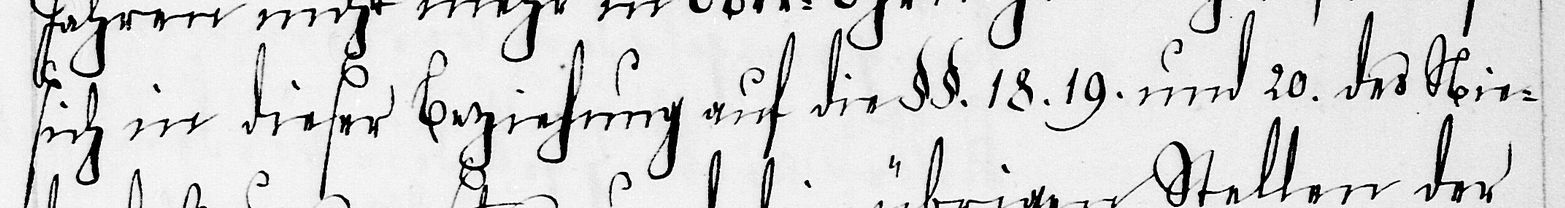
sich in dieser Beziehung auf die §§. 18. 19. und 20. des Nie¬
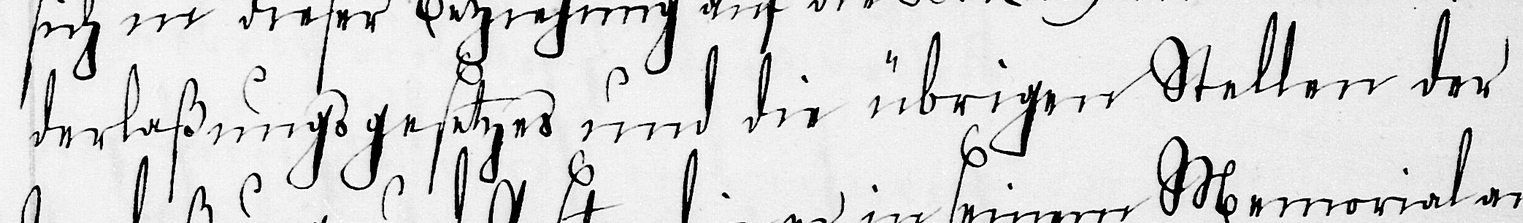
derlaßungsgesetzes und die übrigen Stellen der
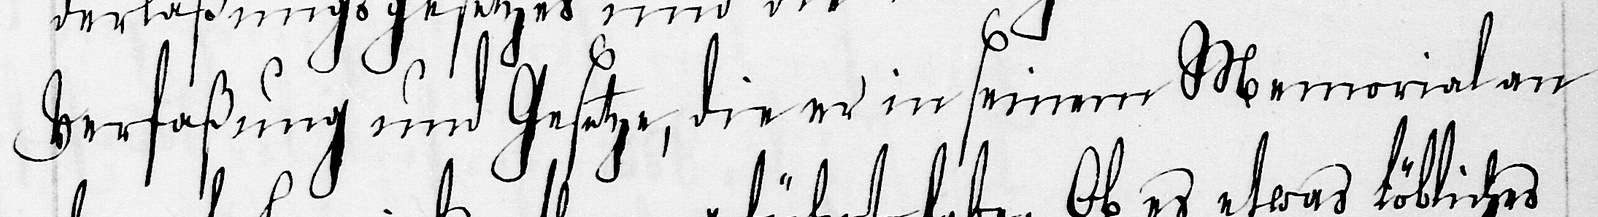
Verfaßung und Gesetze, die er in seinem Memorial an
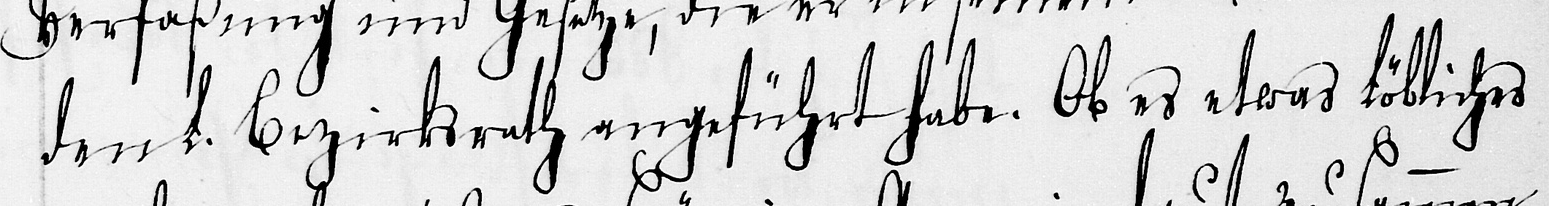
den L. Bezirksrath angeführt habe. Ob es etwas Löbliches
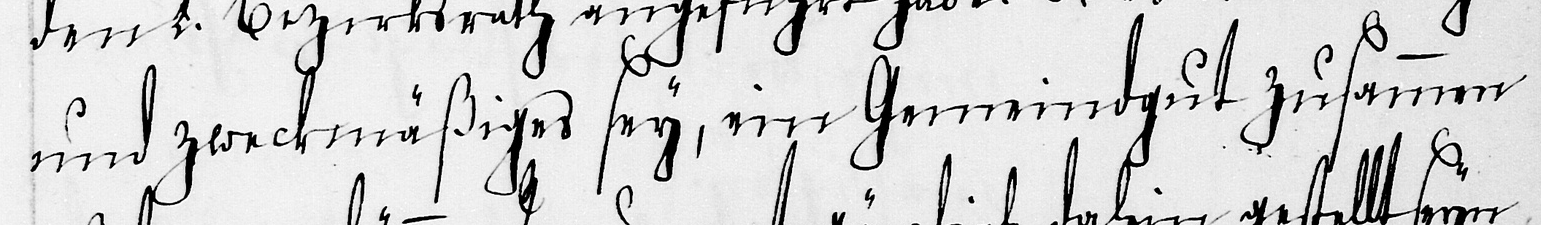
und zweckmäßiges sey, ein Gemeindgut zusammen
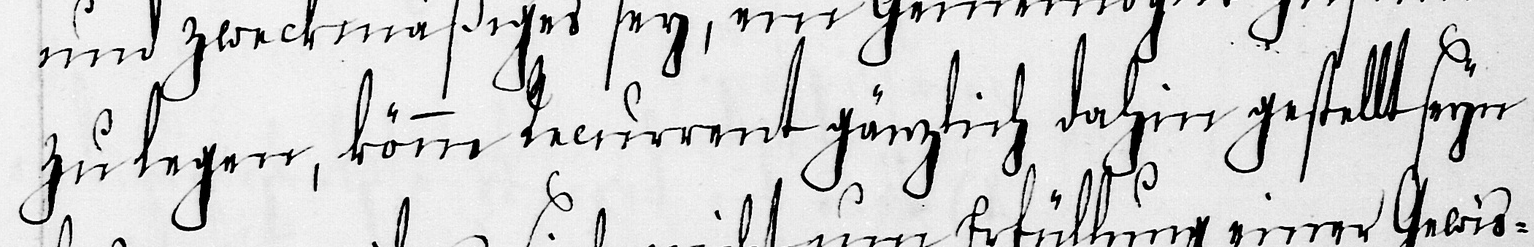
zu legen, könne Recurrent gänzlich dahin gestellt seyn
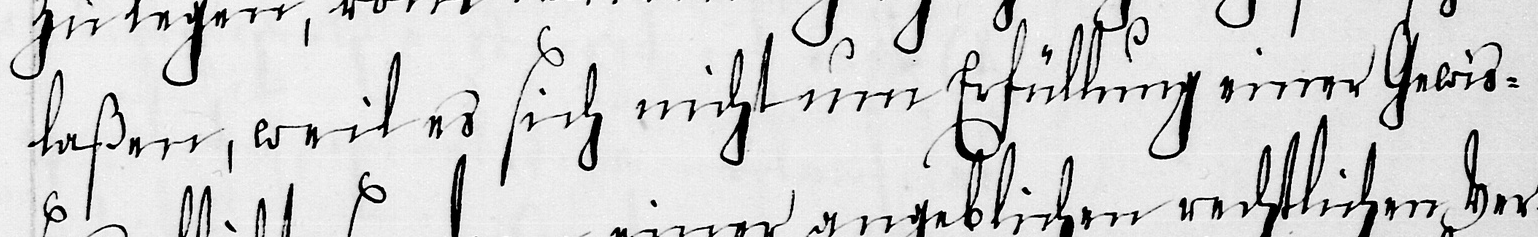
laßen, weil es sich nicht um Erfüllung einer Gewiß¬
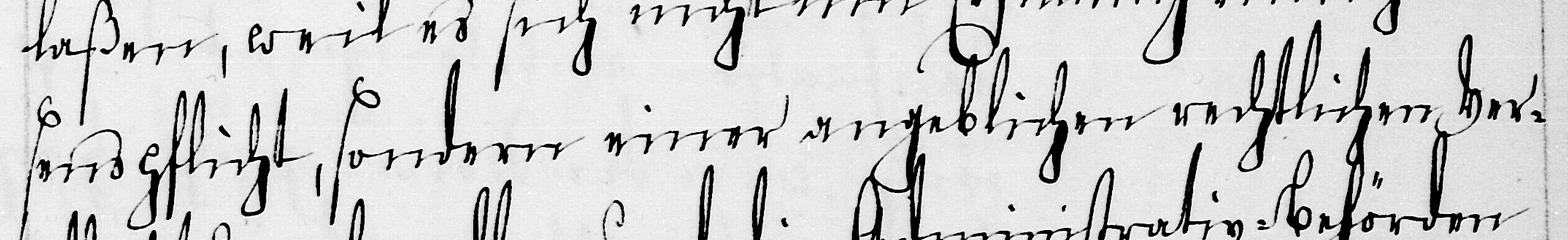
enspflicht, sondern einer angeblichen rechtlichen Ver¬
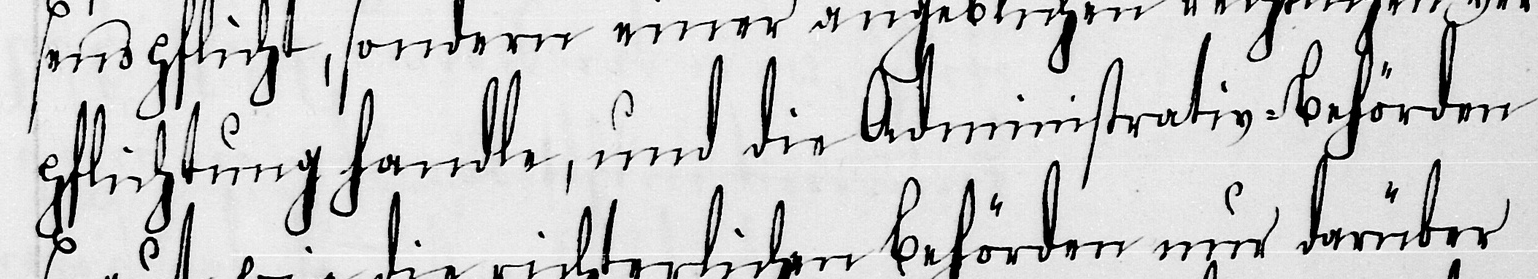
pflichtung handle, und die Administrativ-Behörden
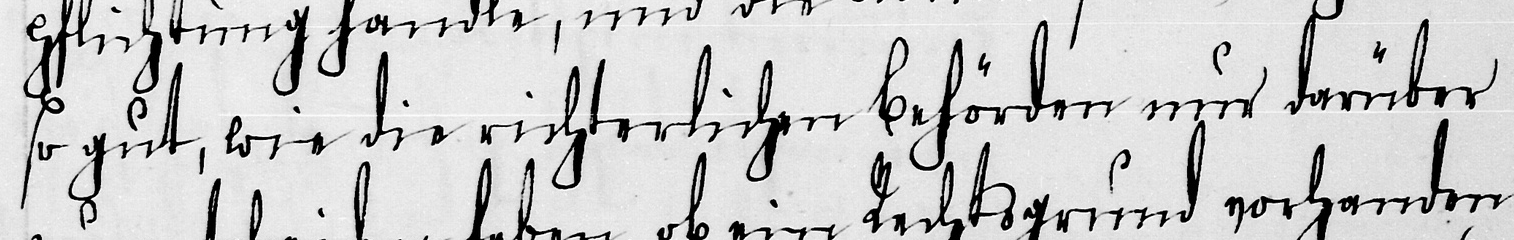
so gut, wie die richterlichen Behörden nur darüber
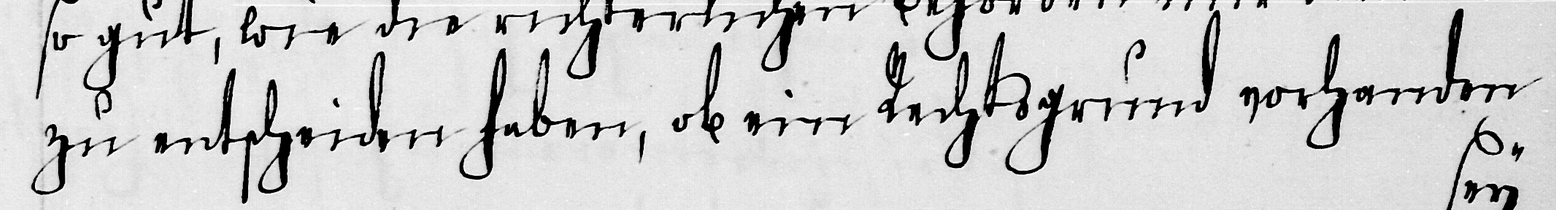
zu entscheiden haben, ob ein Rechtsgrund vorhanden
